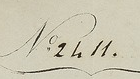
No 2411.
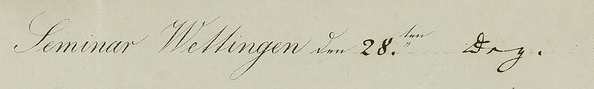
Seminar Wettingen, den
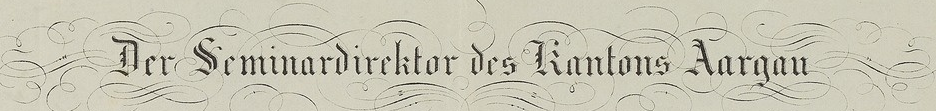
Der Seminardirektor des Kantons Aargau
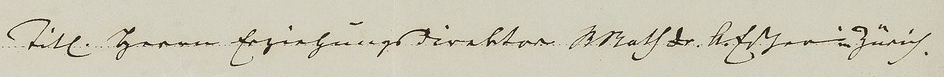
Tit. Herrn Erziehungsdirektor RRath Dr. A. Escher in Zürich
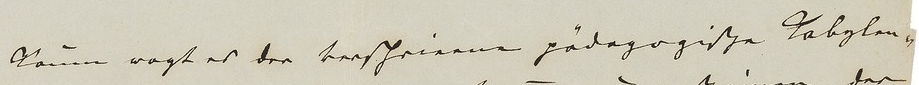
Kaum wagt es der verschriene pädagogische Kabylen-
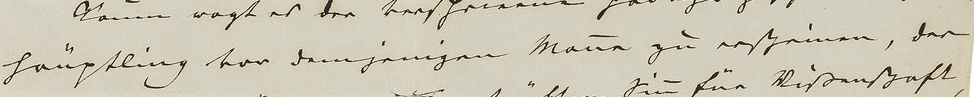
häuptling vor demjenigen Manne zu erscheinen, der
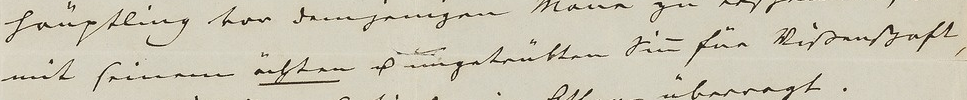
mit seinem ächten & ungetrübten Sinn für Wißenschaft,
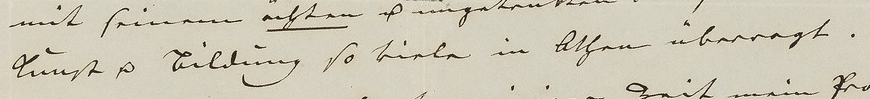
Kunst & Bildung so viele in Athen überragt.
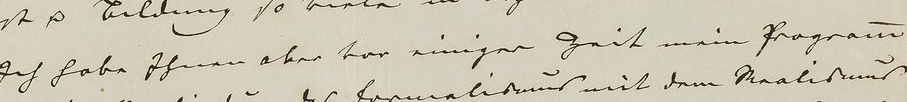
Ich habe Ihnen aber vor einiger Zeit mein Programm
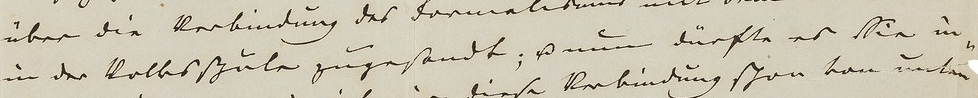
in der Volksschule zugesandt; & nun dürfte es Sie in-
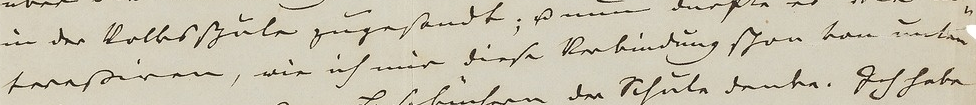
tereßiren, wie ich mir diese Verbindung schon von unten
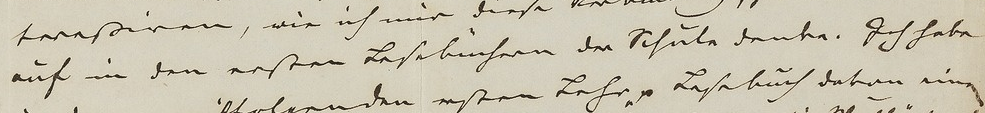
auf in den ersten Lesebüchern der Schule denke. Ich habe
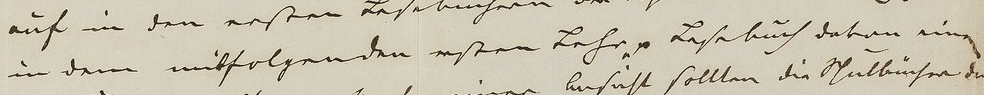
in dem mitfolgenden ersten Lehr- & Lesebuch davon einen
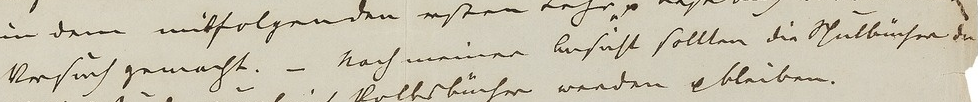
Versuch gewagt. – Nach meiner Ansicht sollten die Schulbücher der
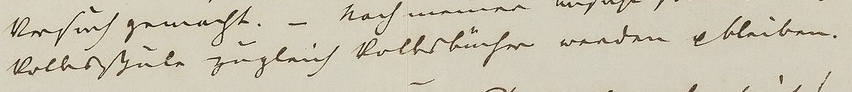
Volksschule zugleich Volksbücher werden & bleiben.
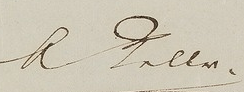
A Keller.
